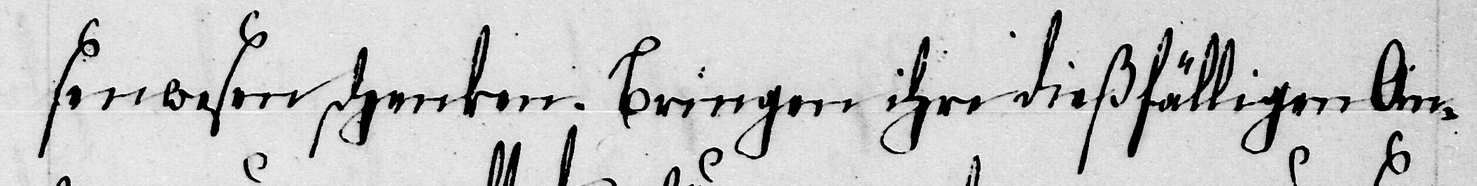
senwesen schenken. Bringen ihre dießfälligen An¬
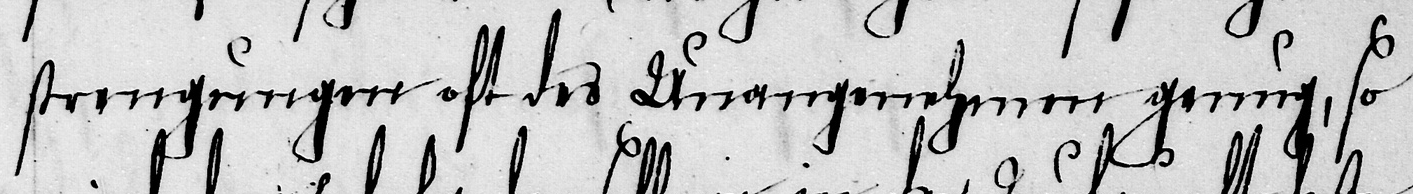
strengungen oft des Unangenehmen genug, so
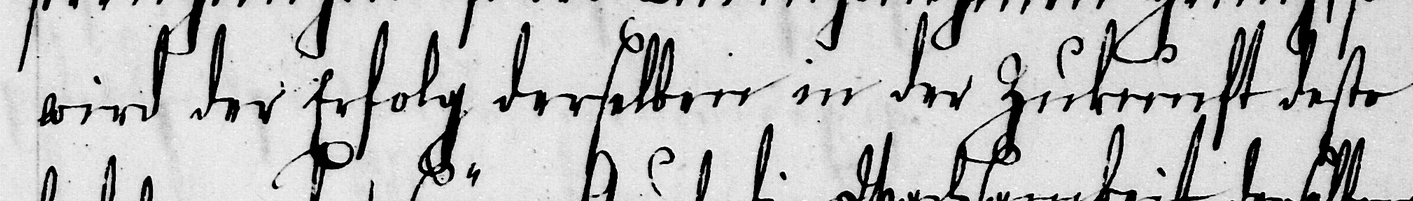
wird der Erfolg derselben in der Zukunft desto
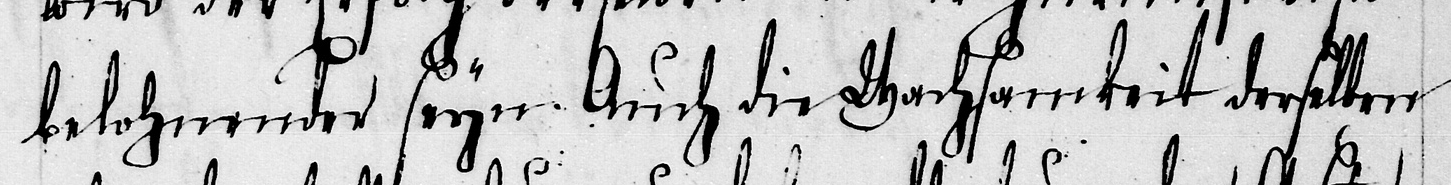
belohnender seyn. Auch die Wachsamkeit derselben
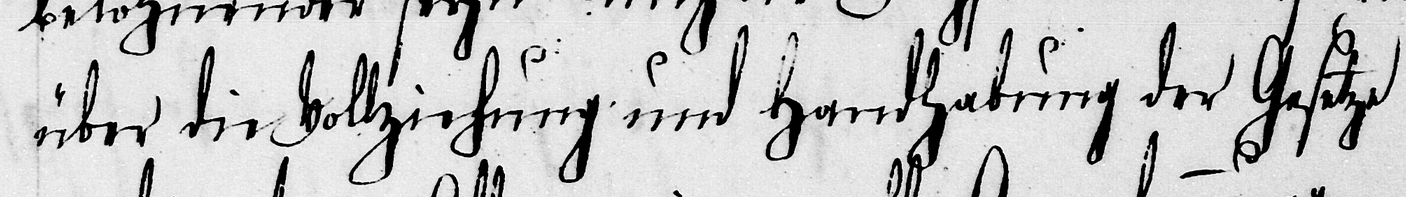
über die Vollziehung und Handhabung der Gesetze
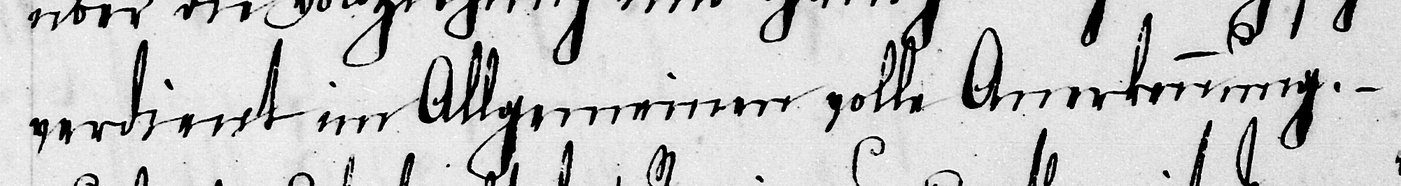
verdient im Allgemeinen volle Anerkennung.
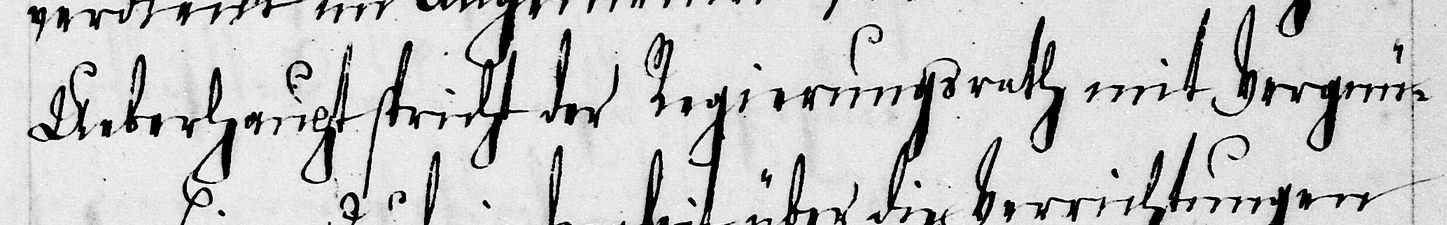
Ueberhaupt spricht der Regierungsrath mit Vergnü¬
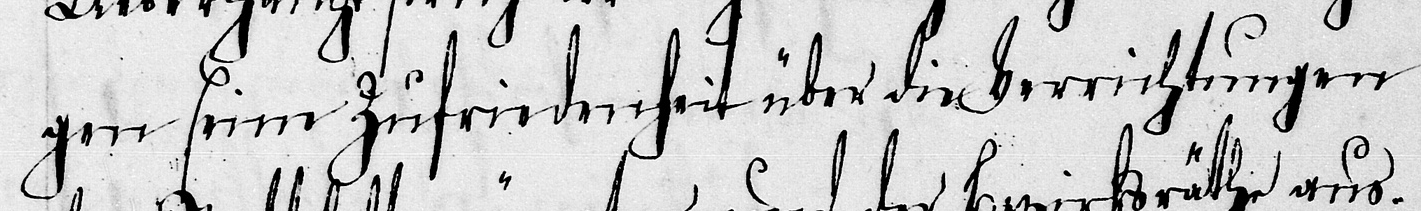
gen seine Zufriedenheit über die Verrichtungen
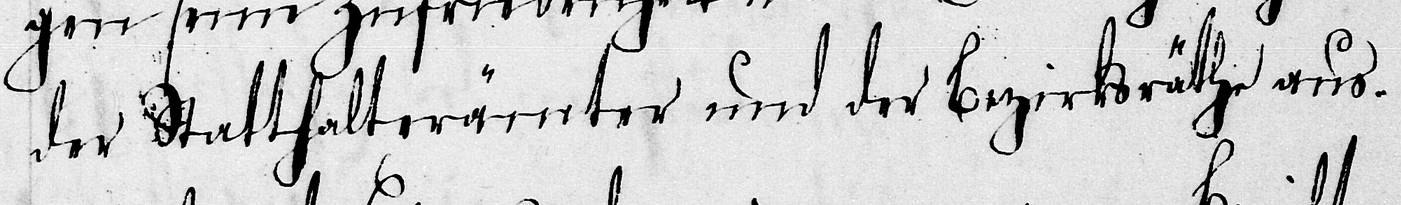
der Statthalterämter und der Bezirksräthe aus.
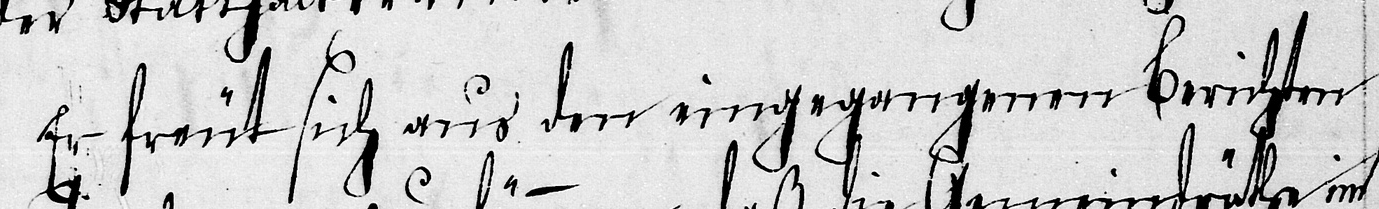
Er freut sich aus den eingegangenen Berichten
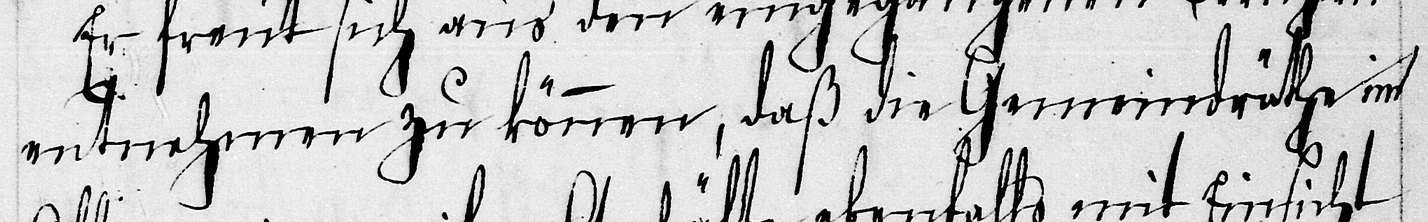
entnehmen zu können, daß die Gemeindräthe im
